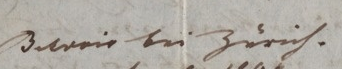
Belvoir bei Zürich.
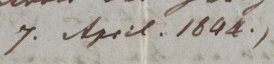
7. April 1844.
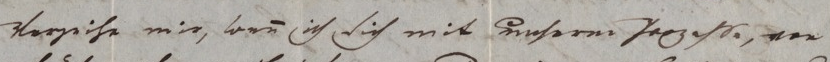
Verzeihe mir, wenn ich dich mit unserm Prozesse, von
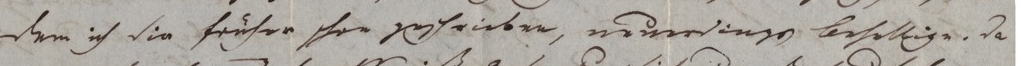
dem ich dir früher schon geschrieben, neuerdings behellige. Da
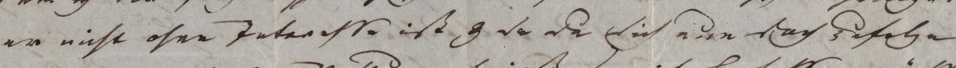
er nicht ohne Interesse ist & da Du dich nun doch zufolge
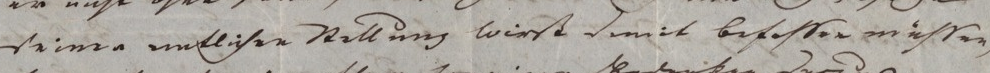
deiner amtlichen Stellung wirst damit befassen müssen,
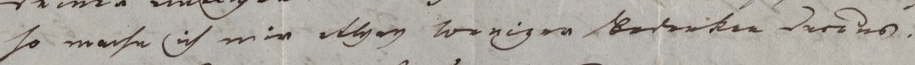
so mache ich mir etwas weniger Bedenken daraus.
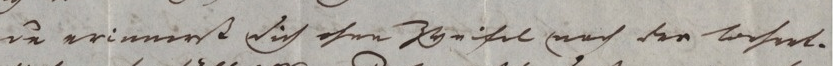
Du erinnerst dich ohne Zweifel noch der wesent-
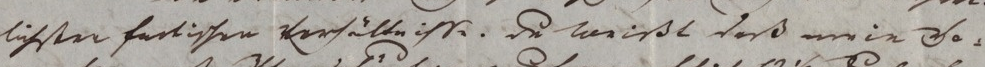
lichsten factischen Verhältnisse. Du weißt, daß mein Va-
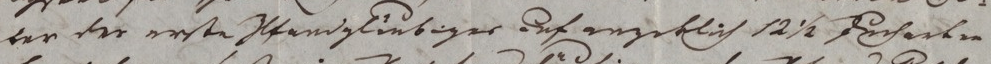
ter der ersten Pfandgläubiger auf angeblich 12 ½ Jucharten
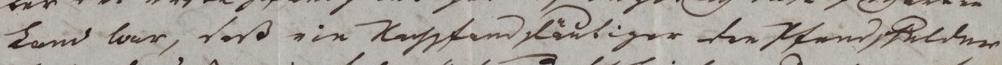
Land war, daß ein Nachpfandgläubiger den Pfandschuldner
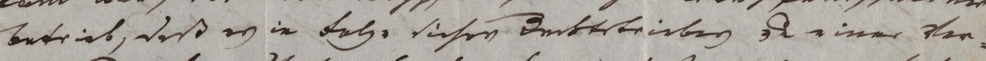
betrieb, daß es in Folge dieses Rechtstriebes zu einer Ver-
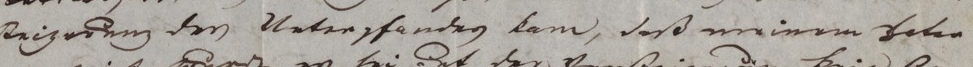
steigerung des Unterpfandes kam, daß meinem Vater
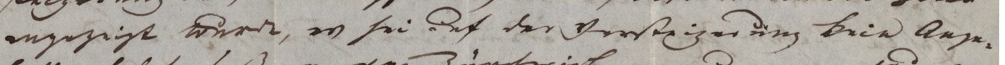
angezeigt wurde, es sei auf der Versteigerung kein Ange-
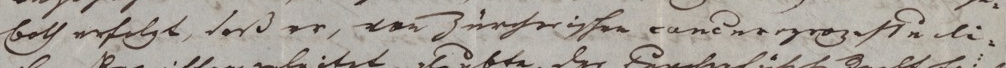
both erfolgt, daß er, von Zürcherischen concursprozesuali-
